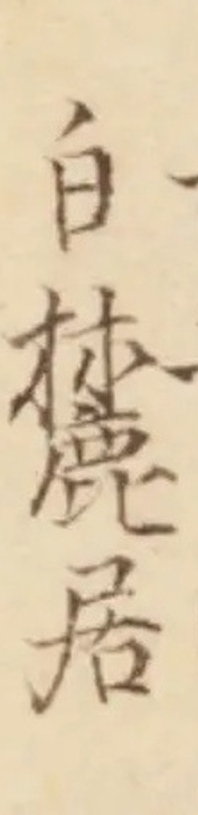白麓居
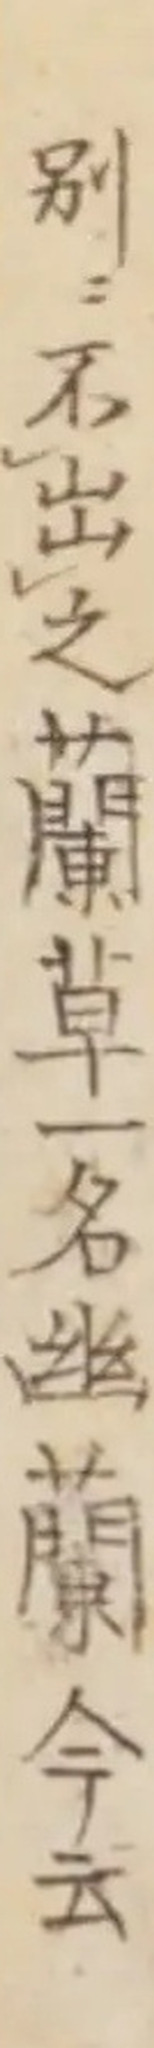別不出之蘭草一名幽蘭今云
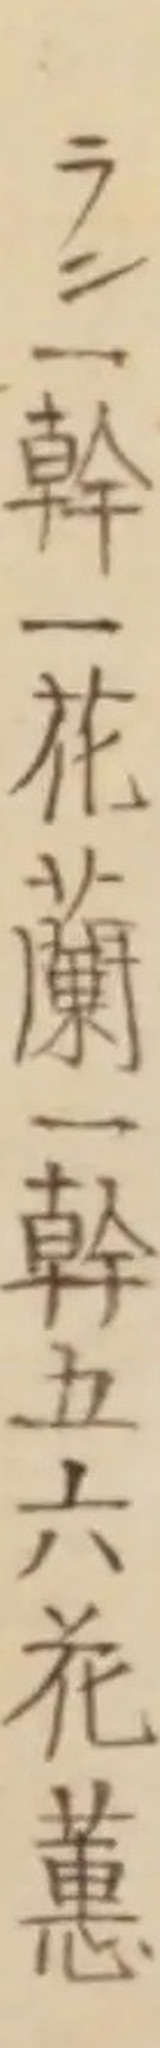ラン一幹一花蘭一幹五六花蕙
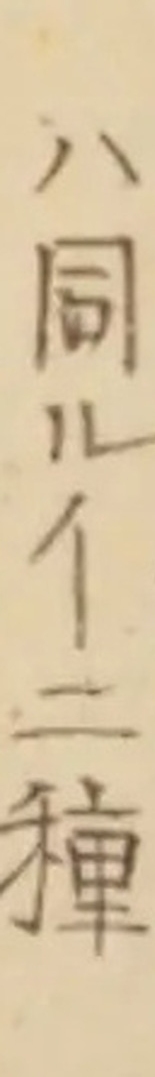ハ同ルイ二種

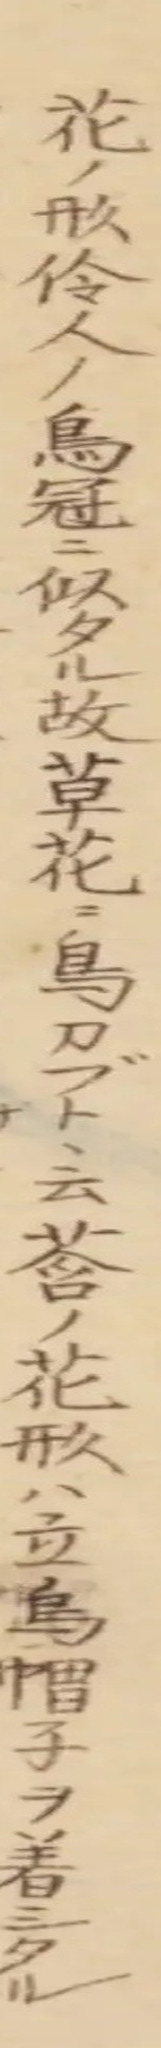花ノ形伶人ノ鳥冠ニ似タル故草花鳥カブトヽ云莟ノ花形ハ立烏帽子ヲ着シタル
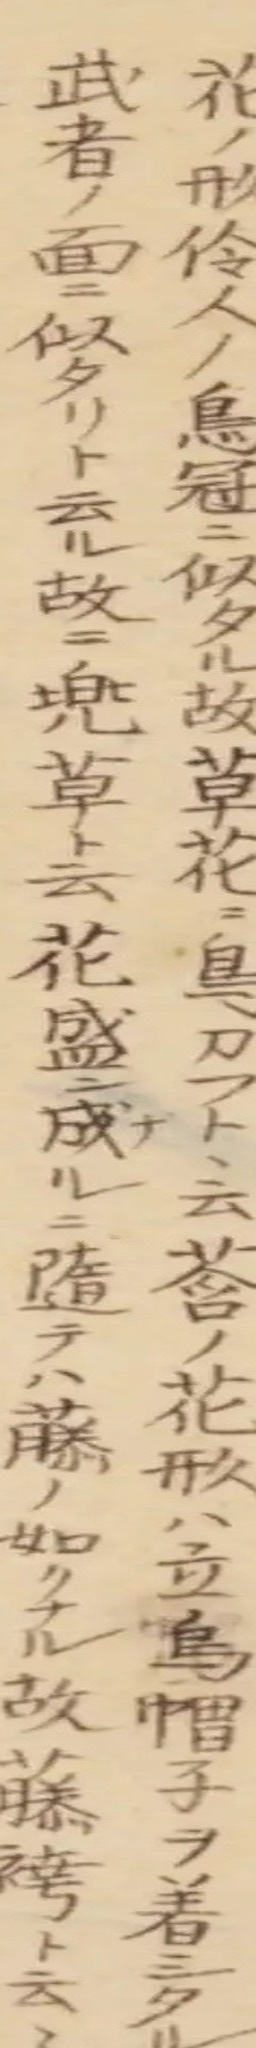武者ノ面ニ似タリト云ル故ニ兜草ト云花盛ン成ルニ随テハ藤ノ如クナル故藤袴云〻
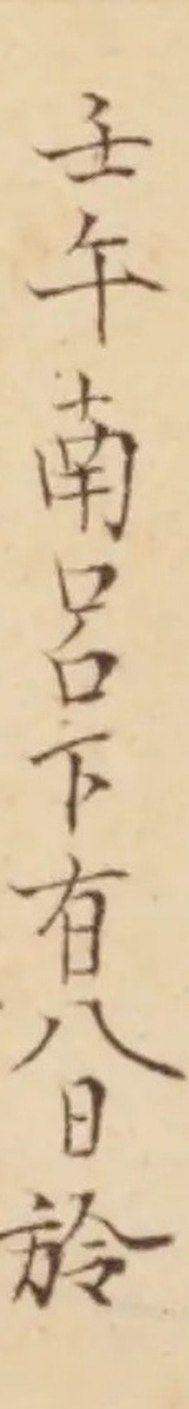壬午南呂下有八日𣃠
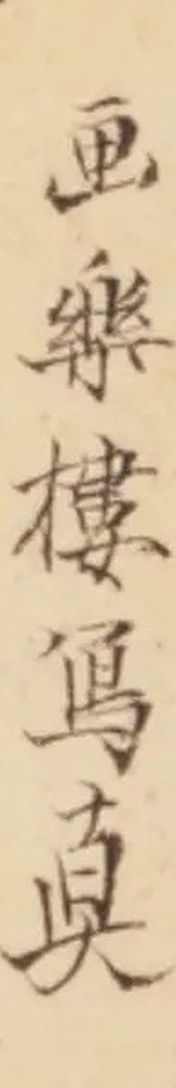画楽楼写真
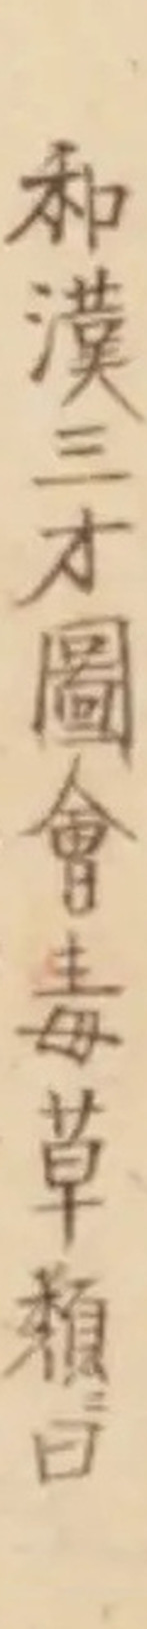和漢三才図会毒草類曰
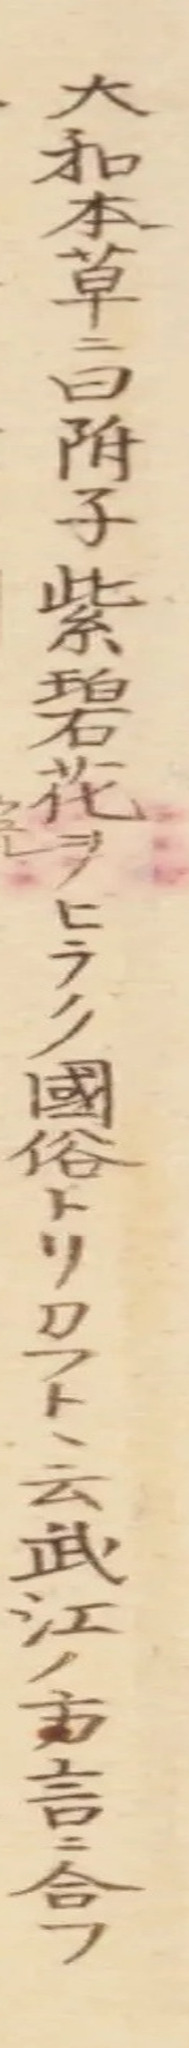大和本草ニ曰附子紫碧花ヲヒラク国俗トリカフトヽ云武江ノ方言ニ合フ
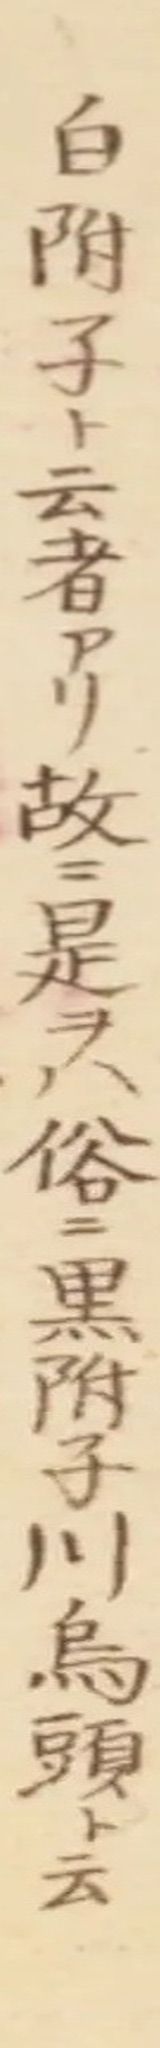白附子ト云者アリ故ニ是ヲハ俗ニ黒附子川烏頭云
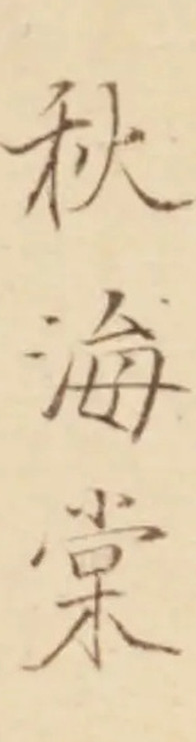秋海棠
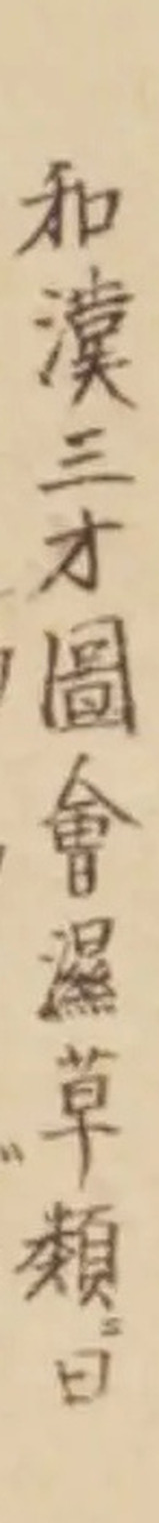和漢三才図会湿草類曰
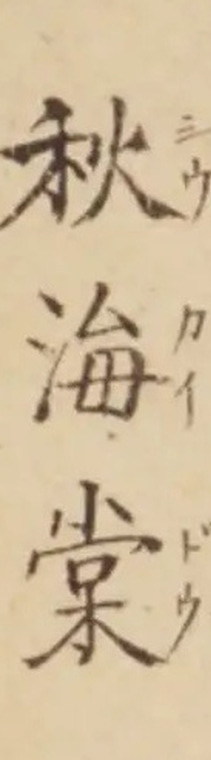秋海棠

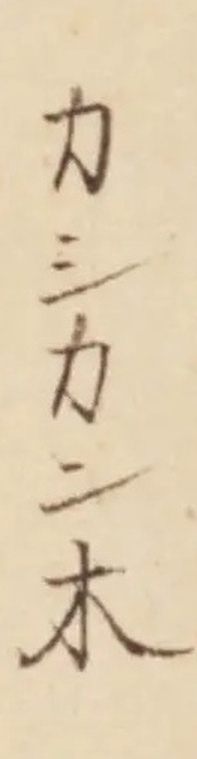カシカン木
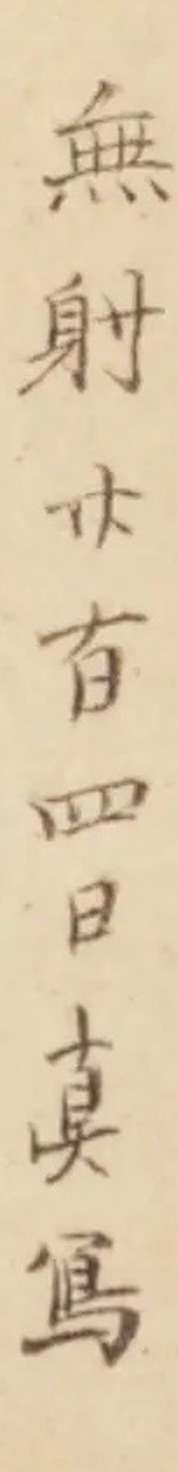無射廿有四日真写
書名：梅園草木花譜秋之部. 1
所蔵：国立国会図書館 National Diet Library, JAPAN
